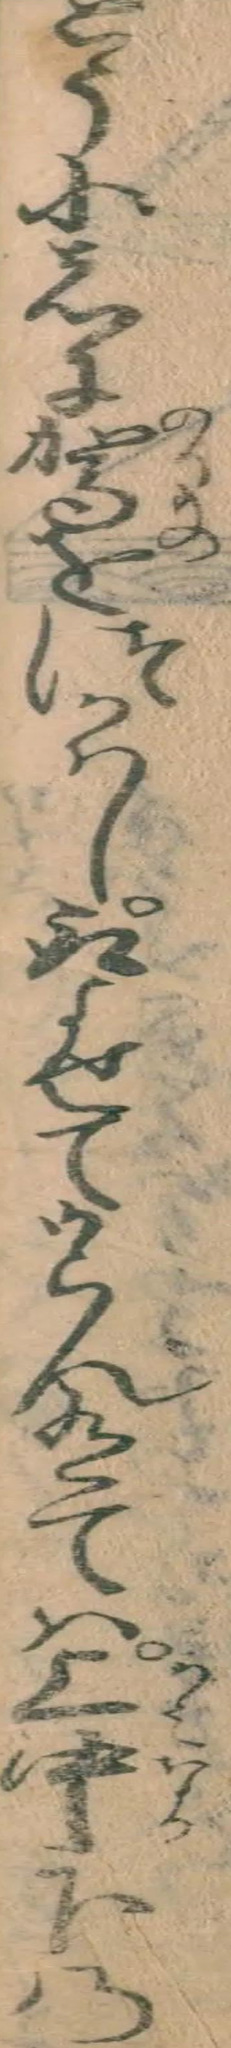とう小者に駕をつかはし。取よせて御らん有ては。上中下の
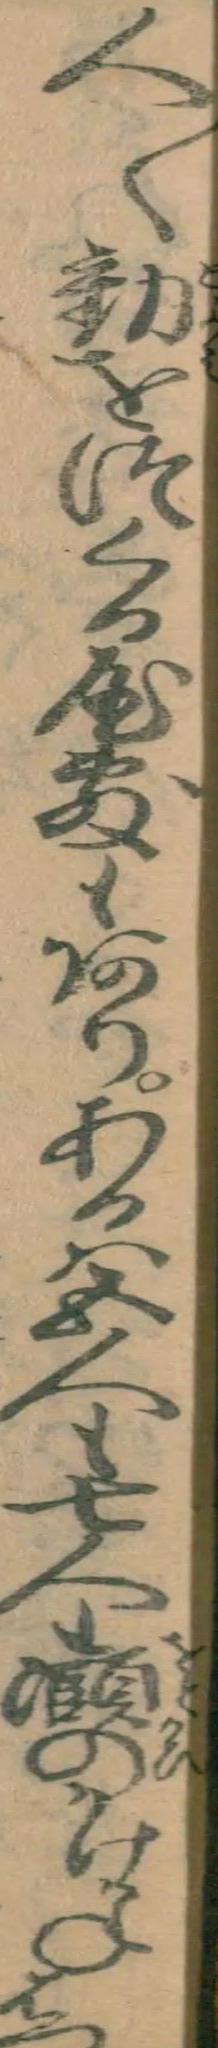人々動をつくる屋敷もあり。あるは五人も七人も頤のかけかねはつ
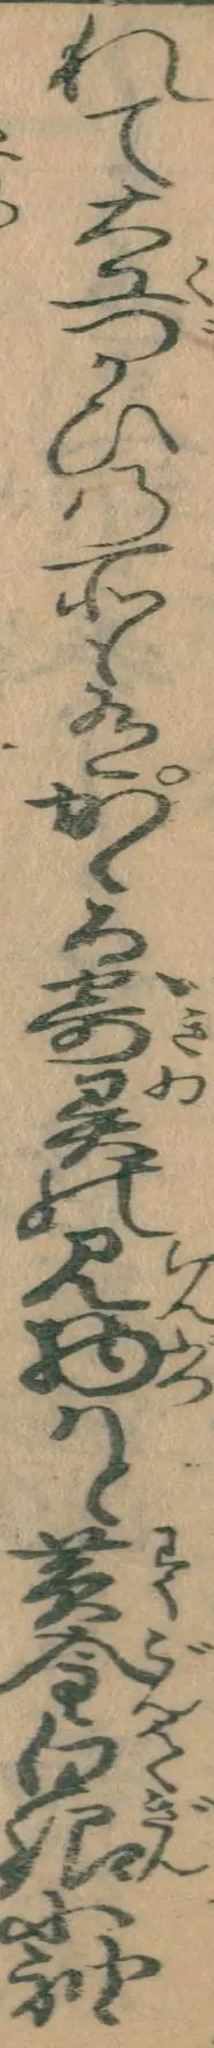れて大工づかひの所も有。かゝる寄異の見物はと黄金白銀小袖
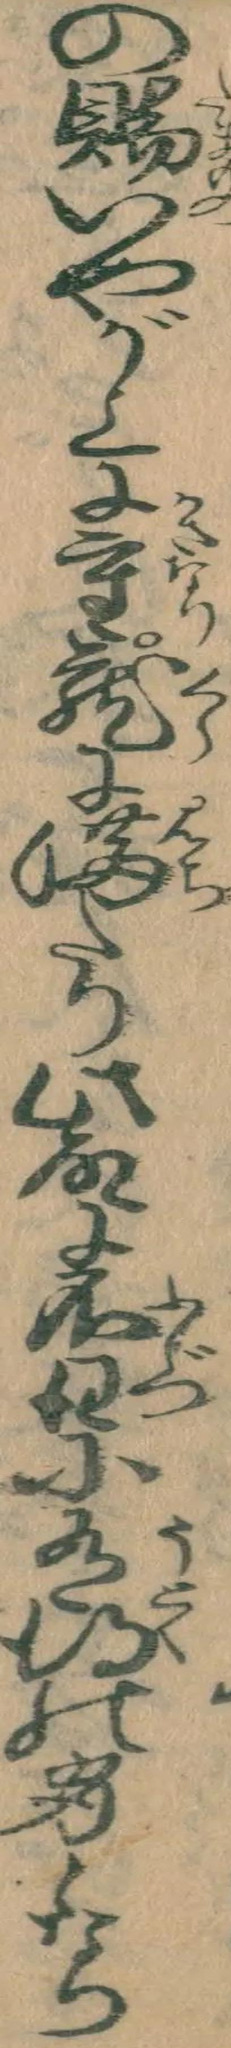の賜いやが上に重。蔵に満たり此故に不日に有得の身となり
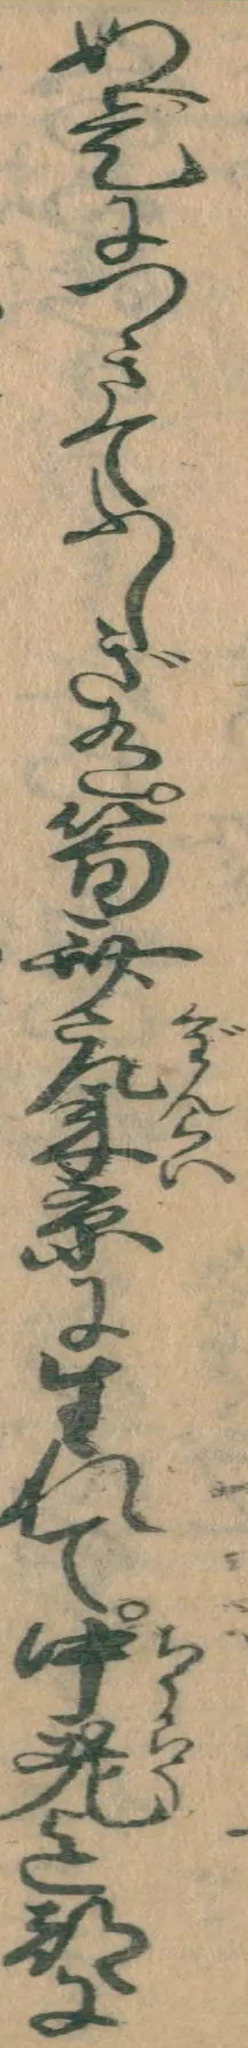ぬ。是につきてふしぎ有。筍斎元来京に生れて。中老迄都に
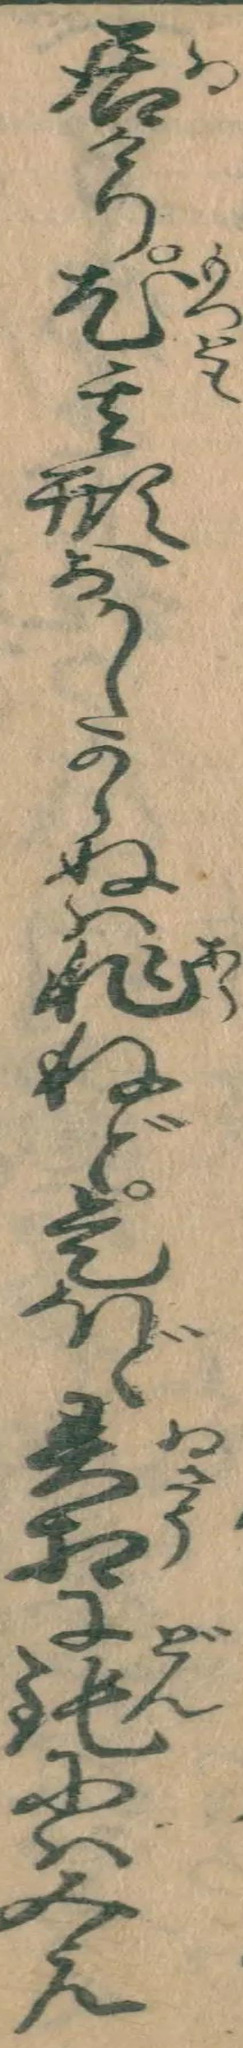居けり。尤其形おかしからぬは非ねど。是ほど異相に鈍にはみえ
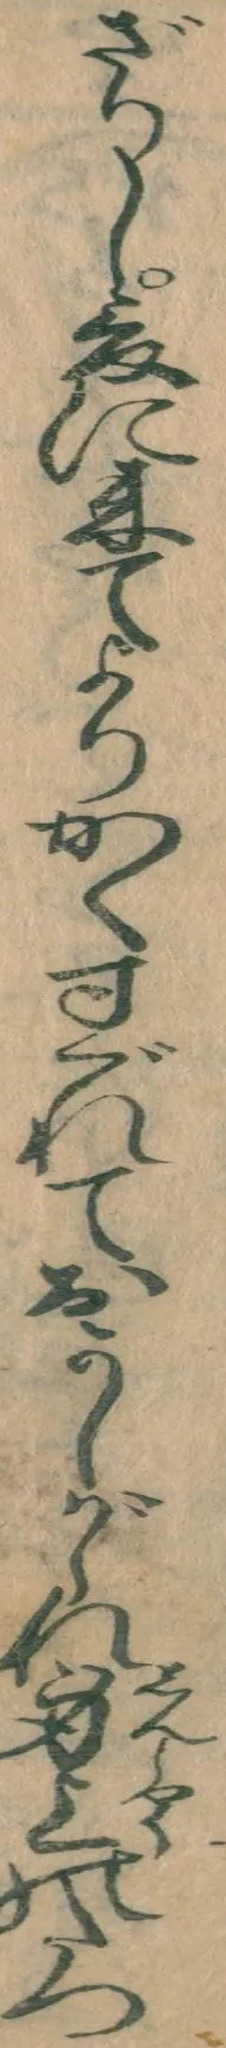ざりし。爰に来てよりかくすぐれておかしがられ身上のたつ
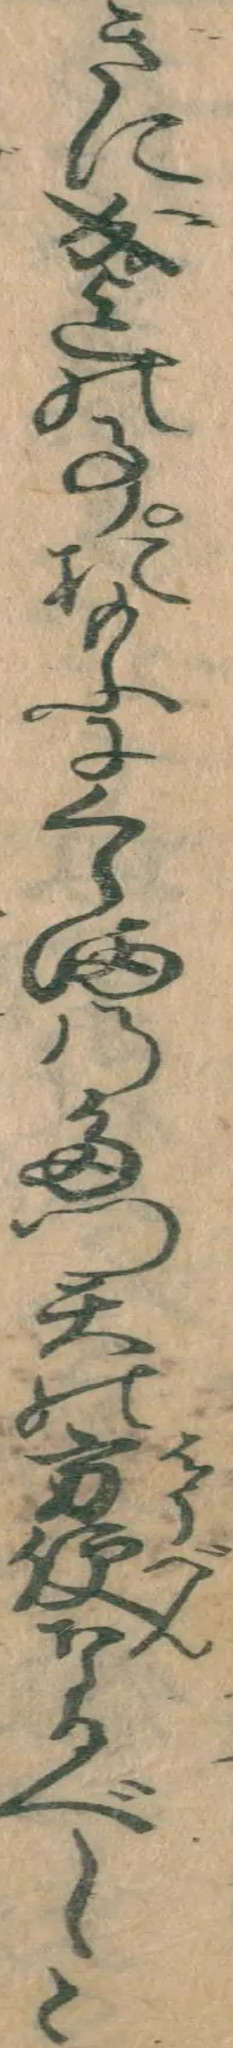きに成迄の事。おもふにくらまの多門天の方便なるべしと
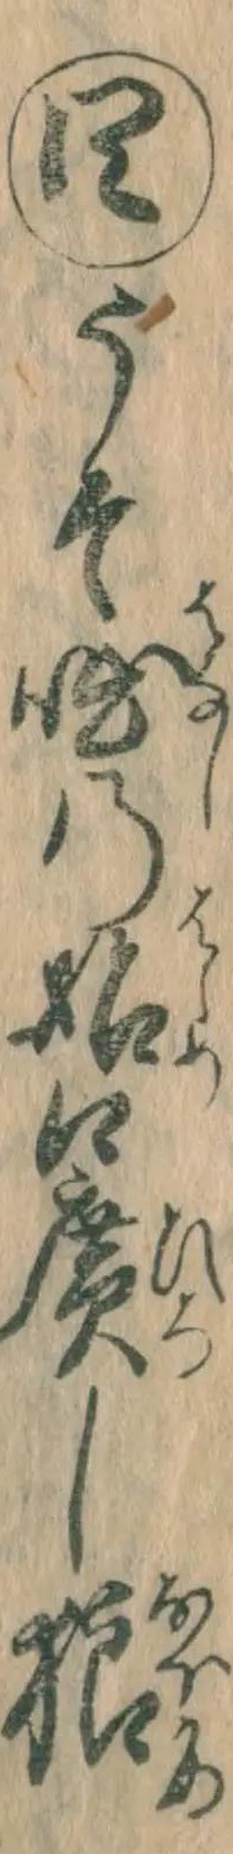四うそ咄の始口広し狼
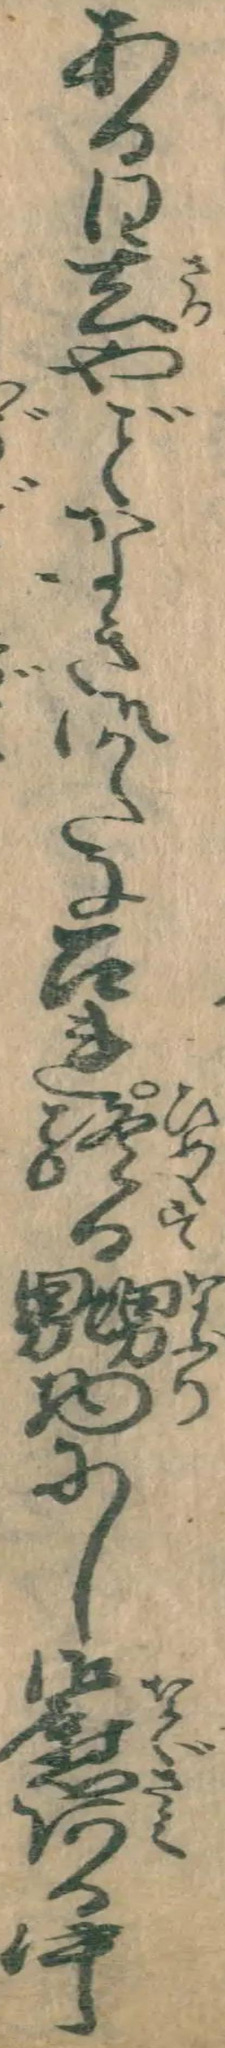ある日去やごとなき御かたに召れ。終日嬲物にし御慰ある中
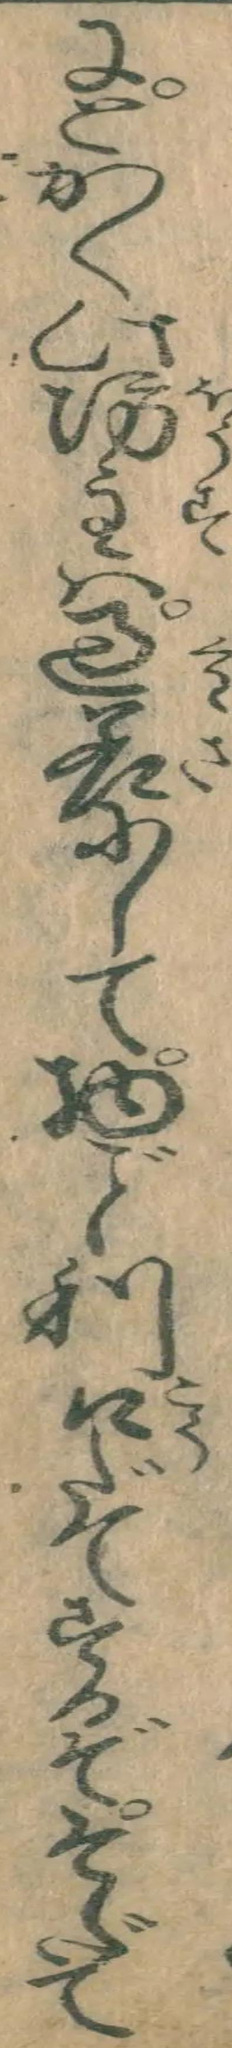に。とかく此坊主は。過差にして。物ごと利口だてするぞ。そだて

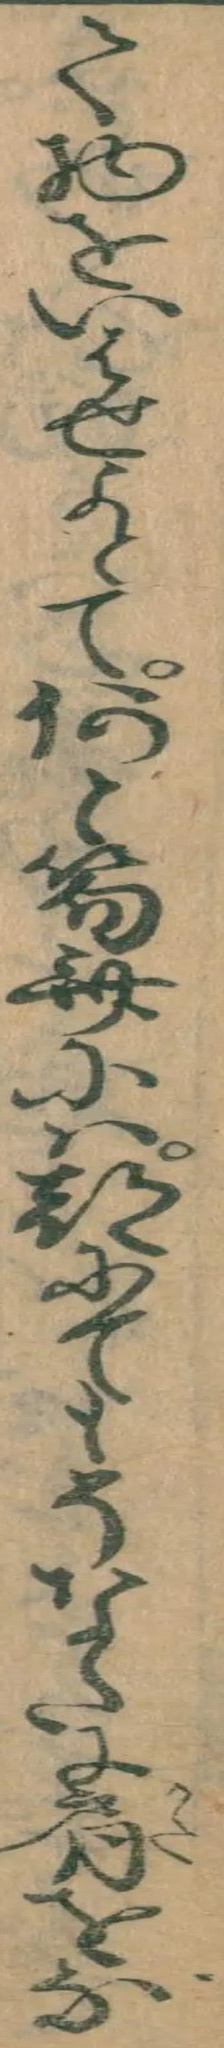て物をいはせよとて。何と筍斎には。都にてもそなたに肩をな
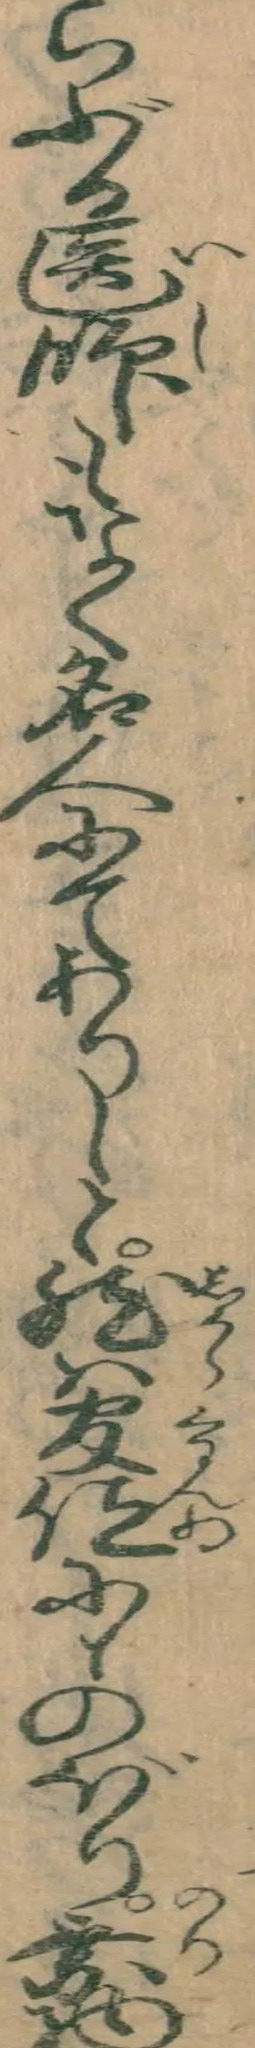らぶる医師もなく名人にてありしと。然は官位にものぼり。乗物
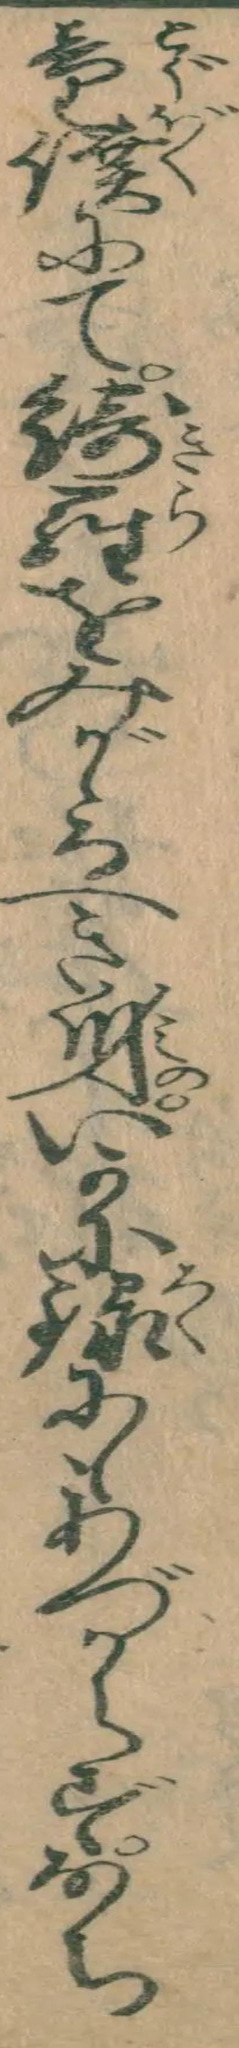童僕にて。綺羅をみがゝるへき身。いかに禄にもあづからず。おち
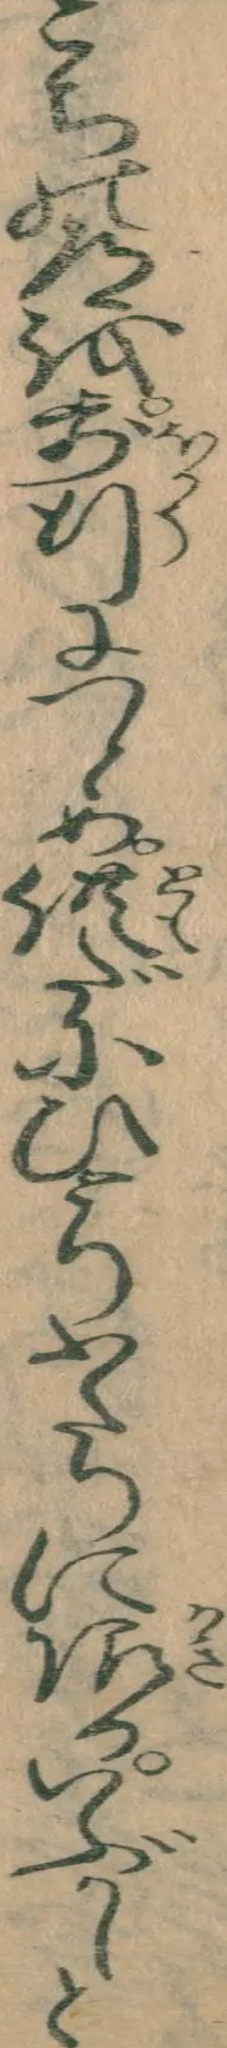こちの道を。歩行につとめ。供だにひとりふたりに限る。いぶかしと
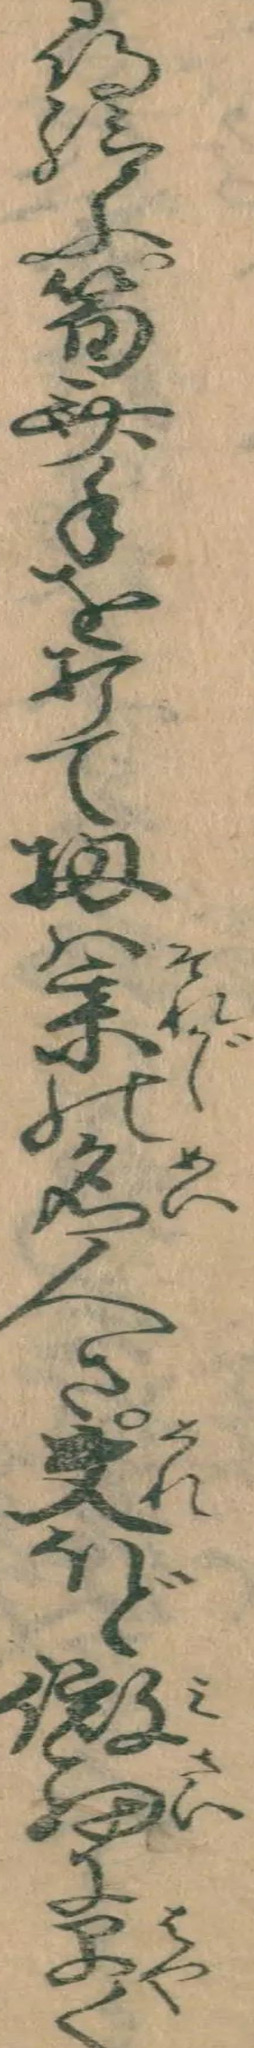尋給ふ。筍斎手を打て扨は某の名人さ。夫ほど微細に早く
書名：新竹斎 5巻
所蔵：国立国会図書館 National Diet Library, JAPAN
